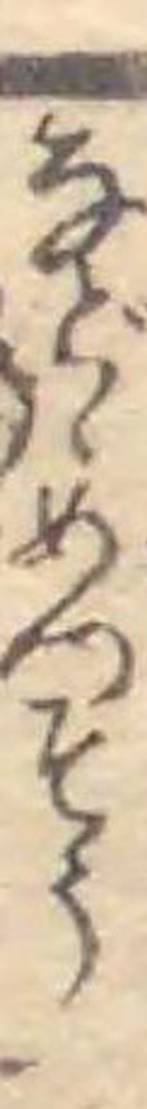などゝめつそう
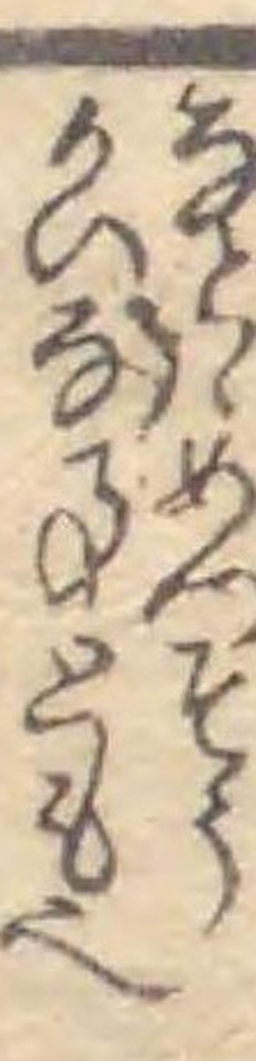かいな事とも也
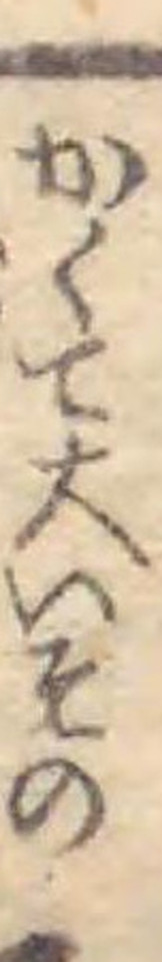かくて大いその
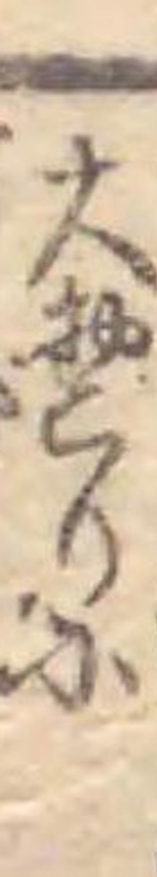大おこりに
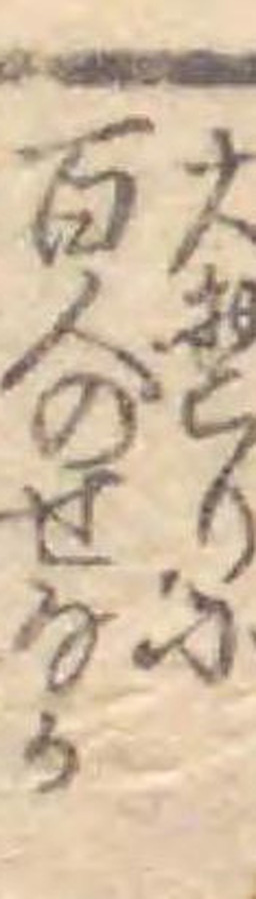百人のせなか
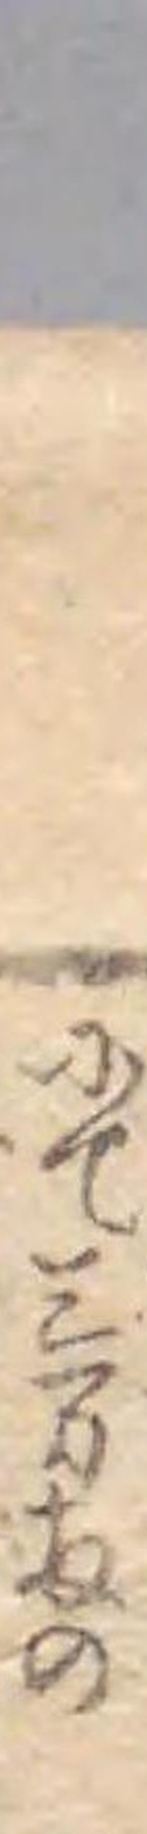にて三百両の
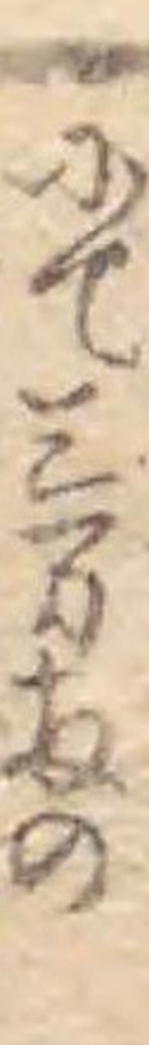にて三百両の
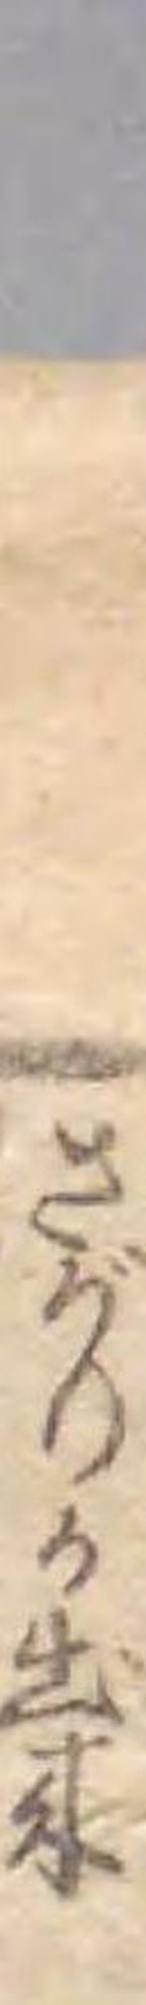さがりか出来
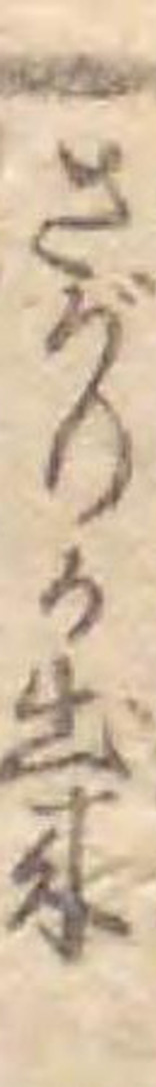さがりか出来
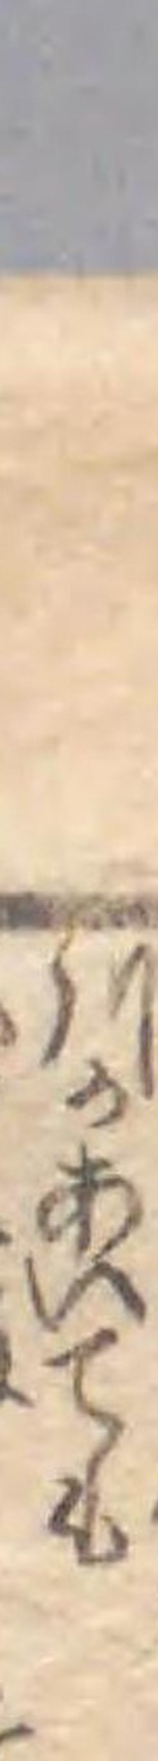川かあいても
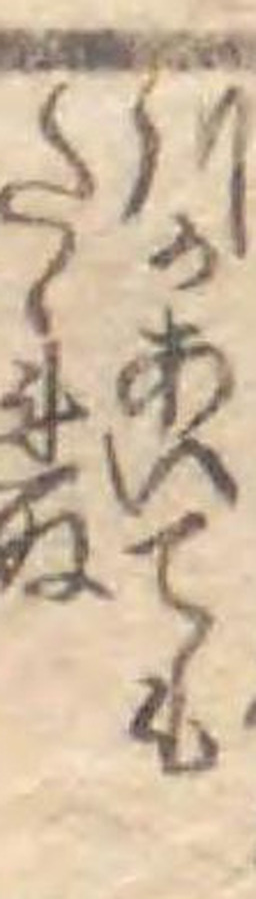たゝれぬ
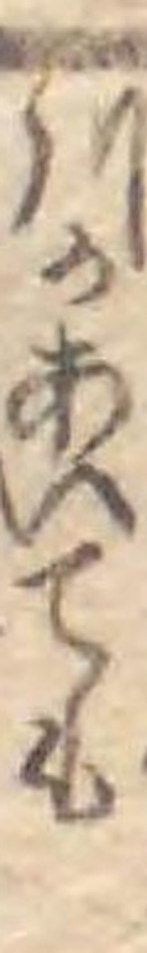川かあいても
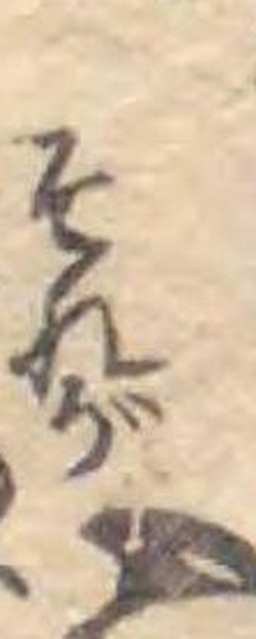それが
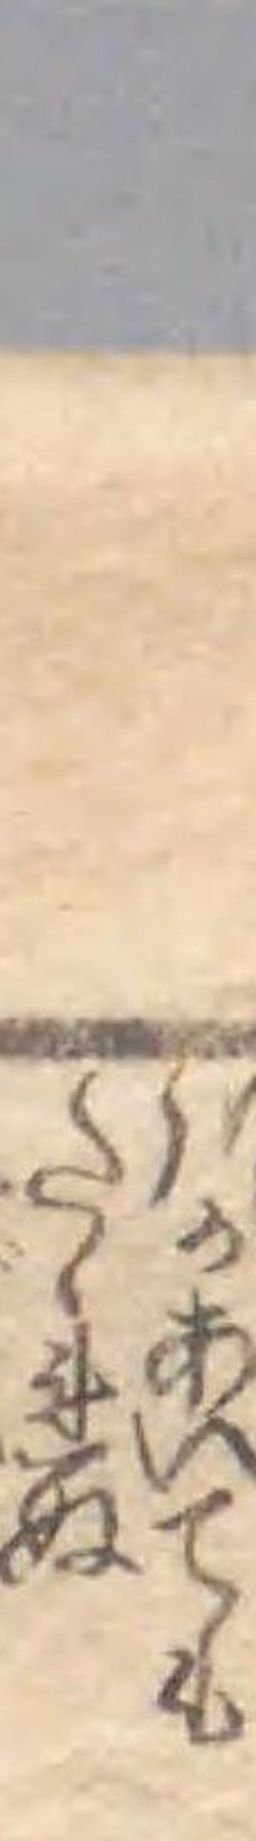たゝれぬ
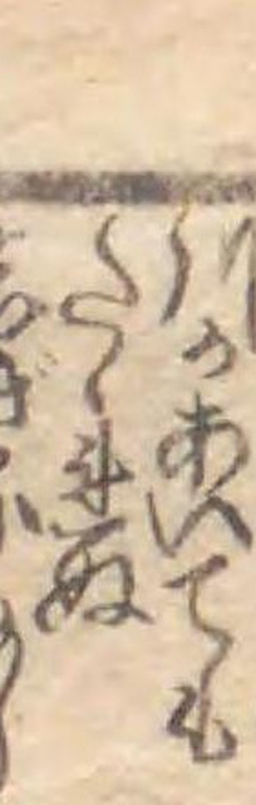たゝれぬ
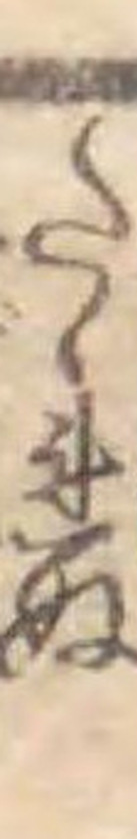たゝれぬ
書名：文武二道万石通 : 3巻
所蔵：国立国会図書館 National Diet Library, JAPAN
